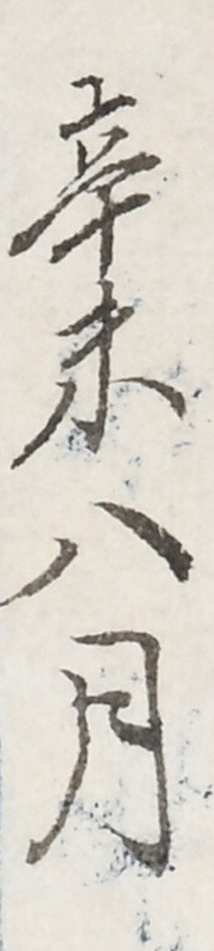辛未八月
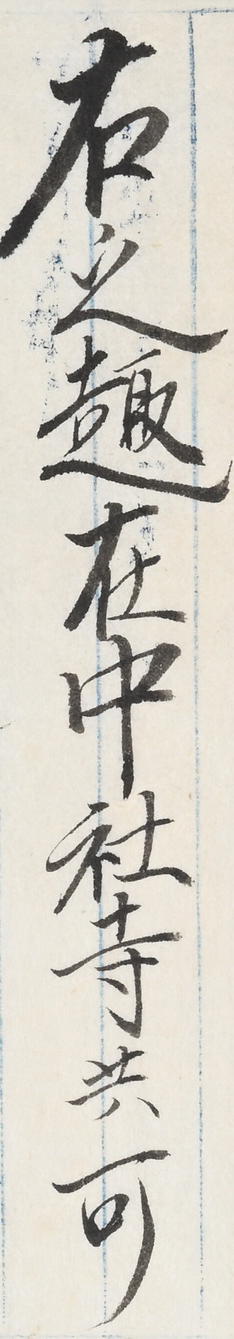右之趣在中社寺共可
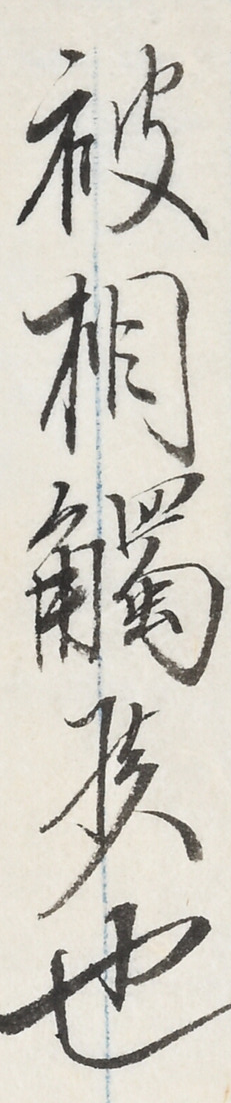被相触候也
